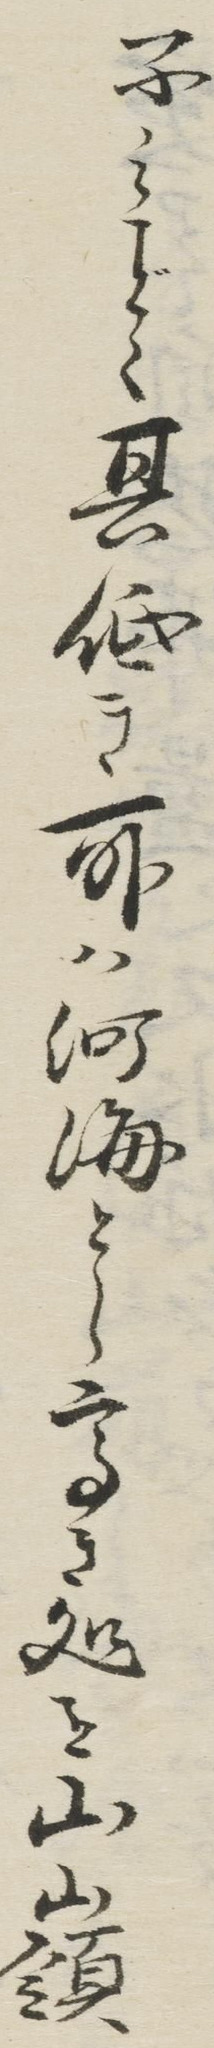子之ごとく其低き所ハ河海とし高き処を山嶺
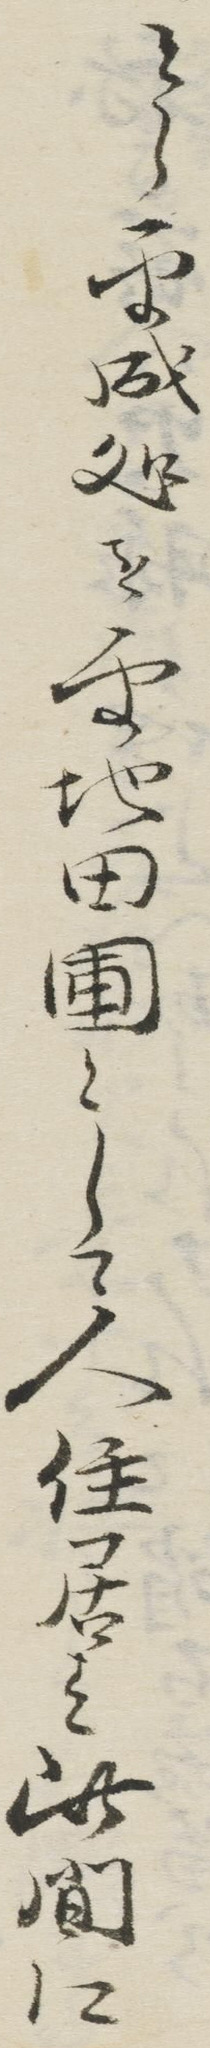として平成処を平地田圃として人住居す此間に
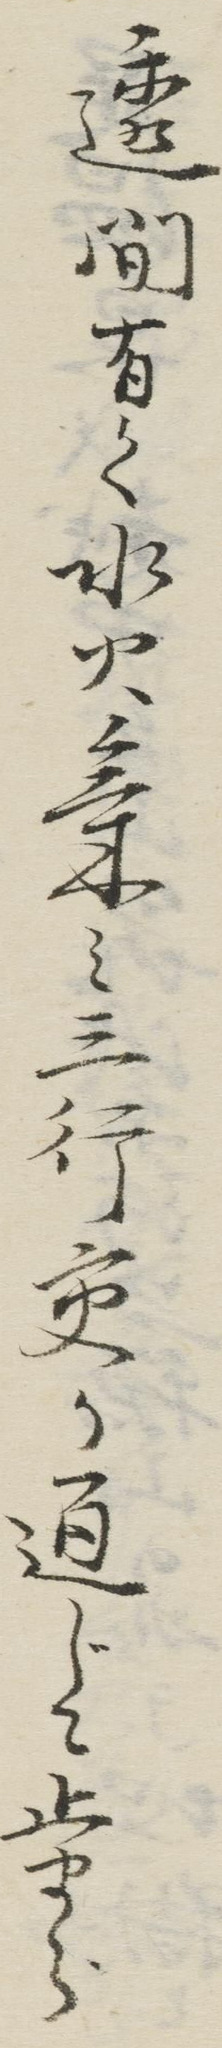透間有て水火気之三行交り通じて止まら
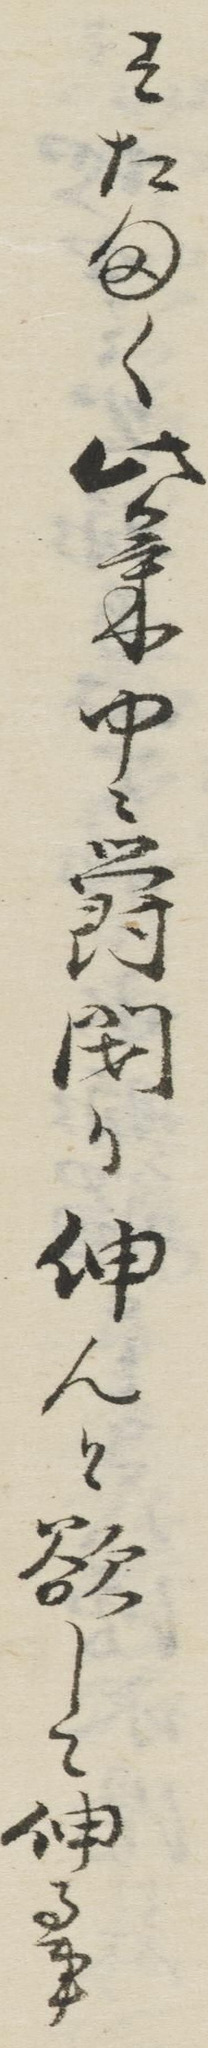すたま〳〵此気中ニ爵閉り伸んと欲して伸る事
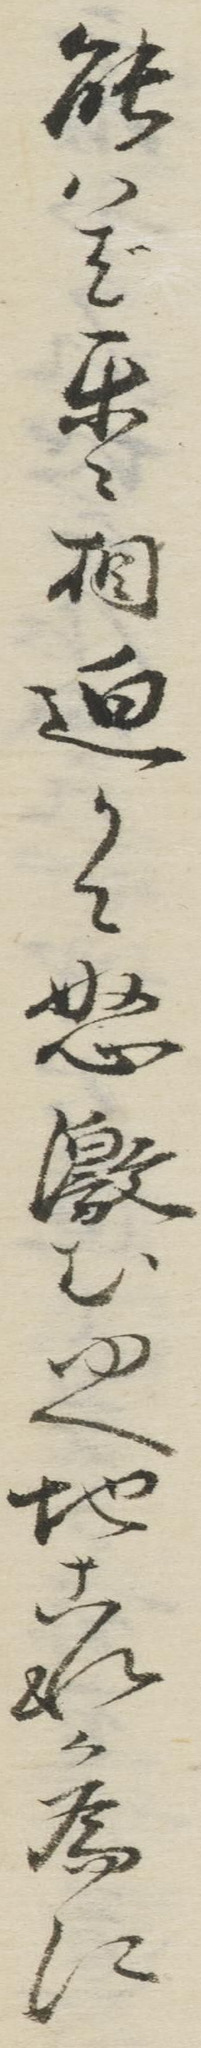能ハず互ニ相迫りて怒激むゆへ地これが為に

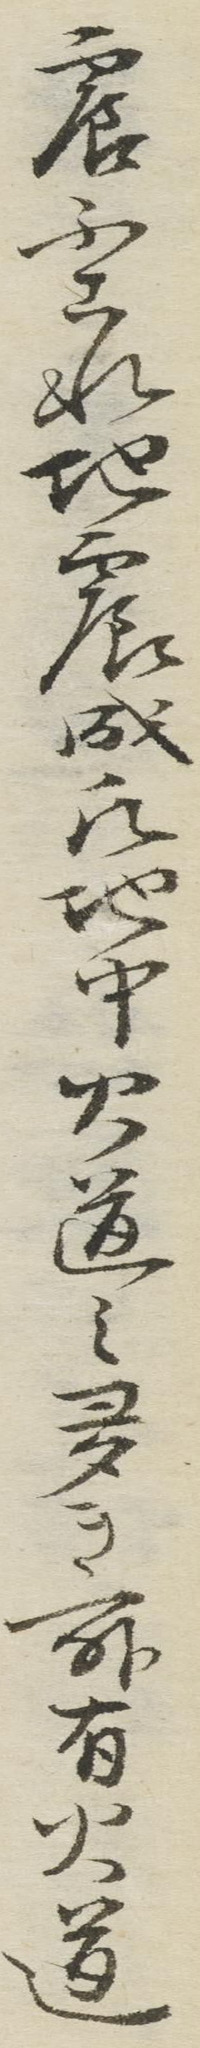震ふこれ地震成凡地中火道之多き所有火道
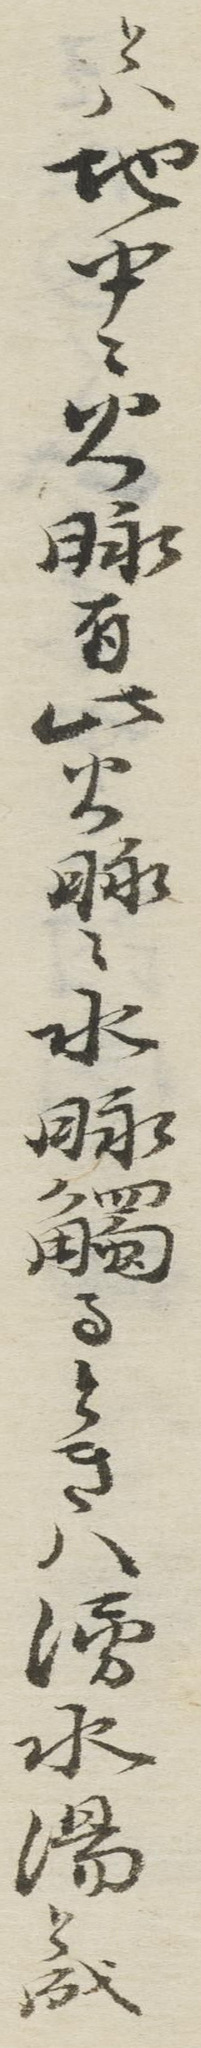とハ地中ニ火脉有此火脉ニ水脉触るときハ湧水湯と成
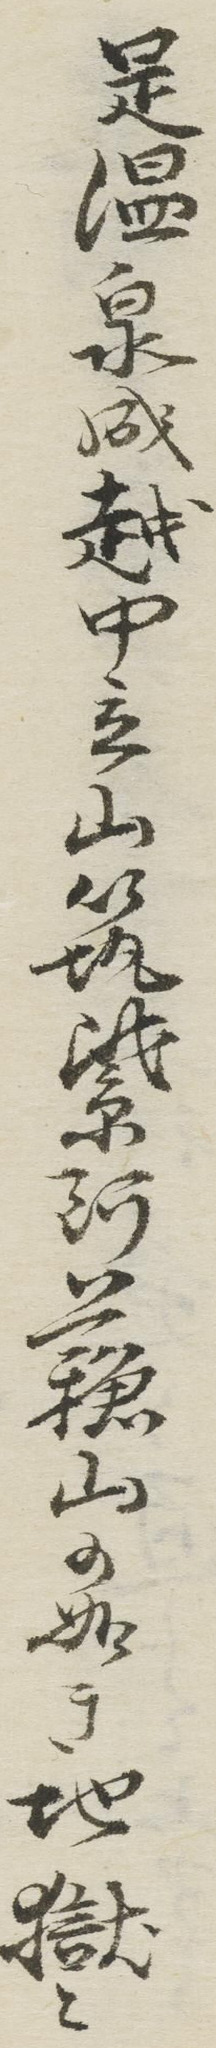是温泉越中立山筑紫阿蘇山の如き地獄と
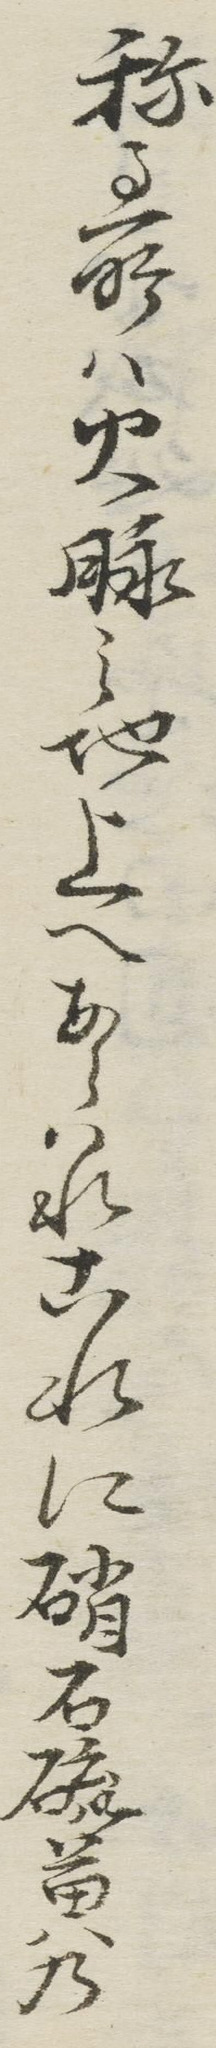称る所ハ火脉之地上へアラハれこれに硝石硫黄の
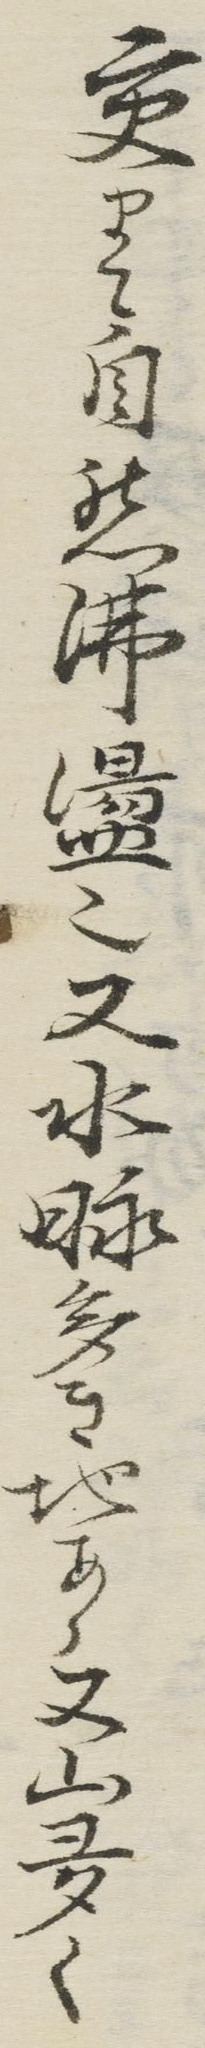交りて自然沸盪也又水脉多き地あり又山多く
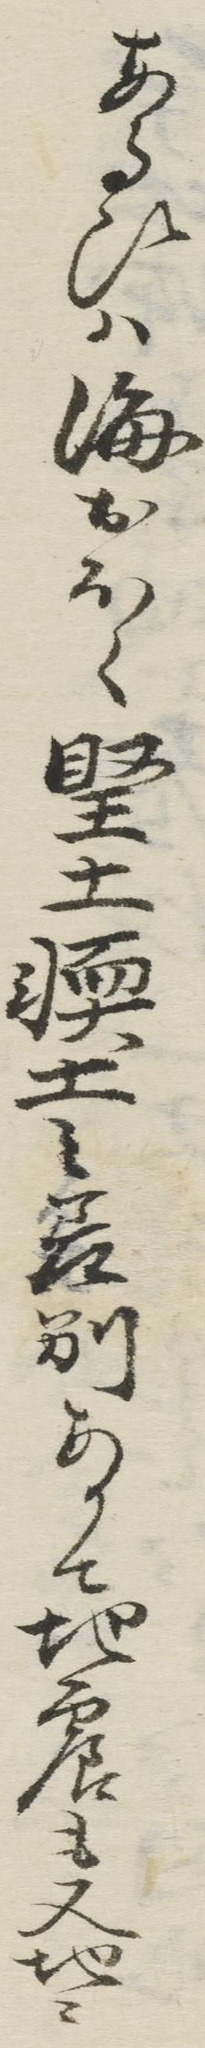あるひハ海おほく堅土輭土之差別ありて地震も又地ニ
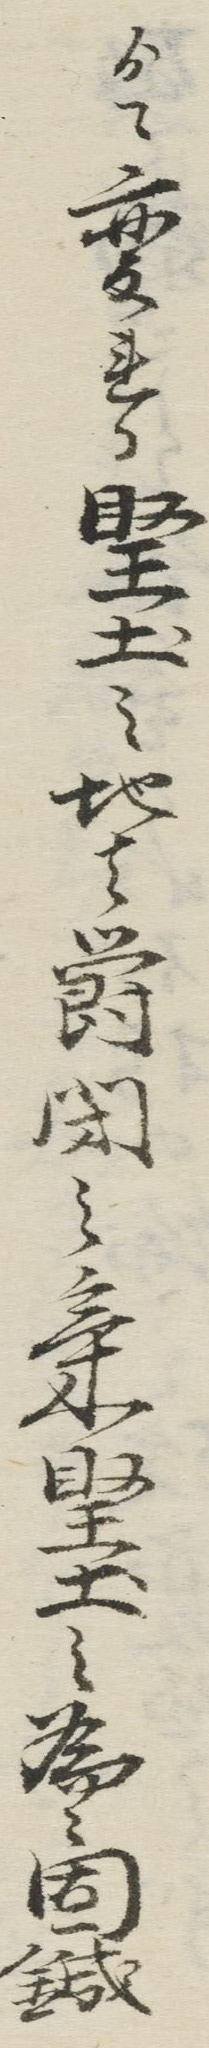ゟて変れり堅土之地は爵閉之気堅土之為ニ固鋮
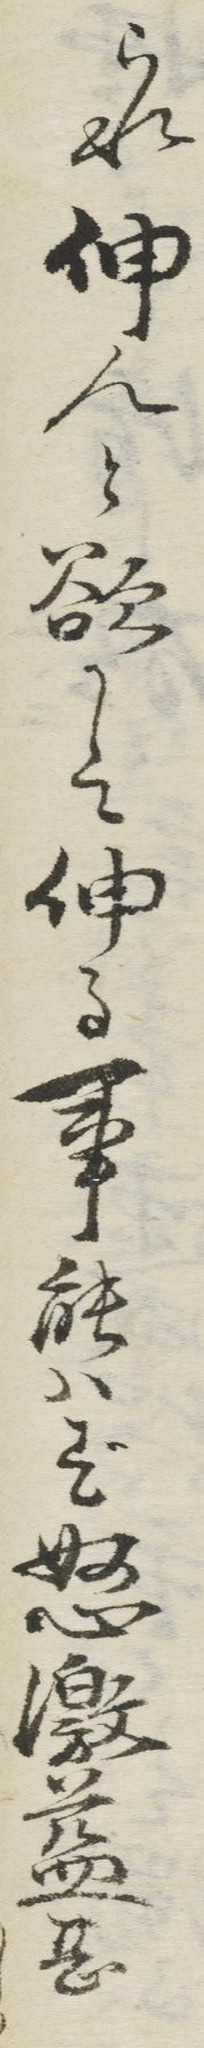られ伸んと欲して伸る事能ハず怒激益甚しく
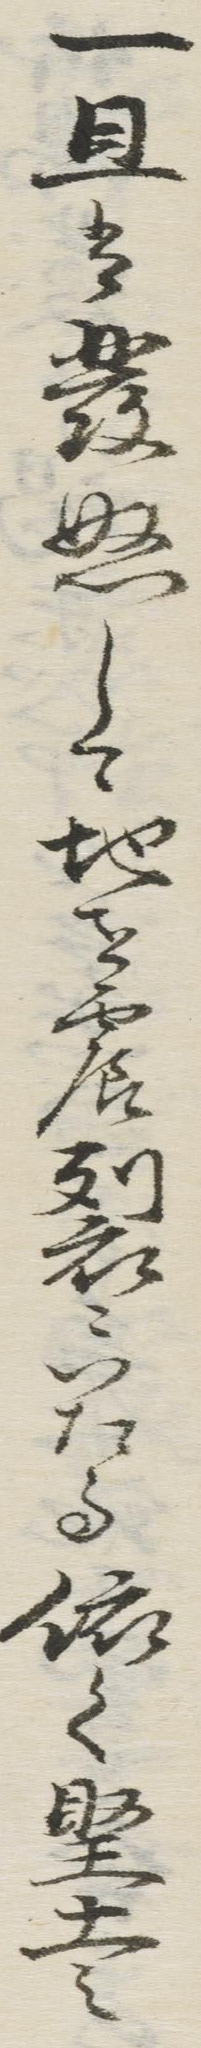一旦は発怒して地を震裂ニいたる依之堅土之
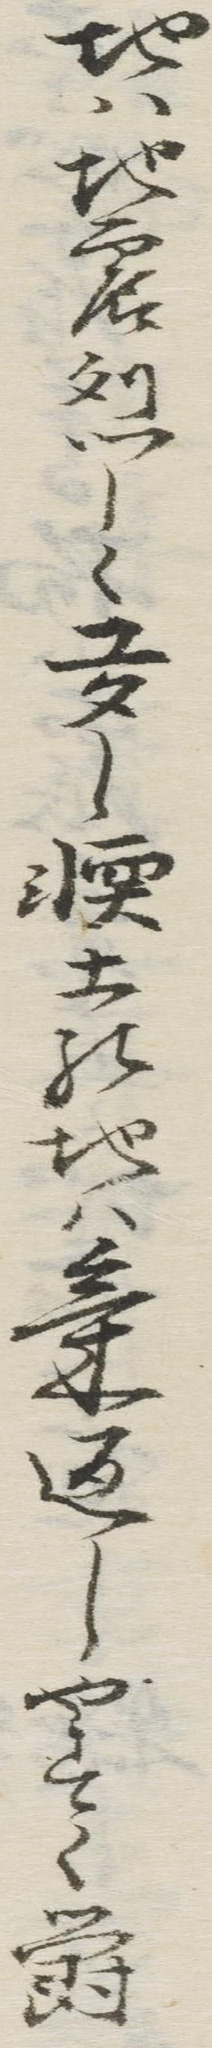地ハ地震烈しくユタ〳〵し輭土の地ハ気返しやすく爵
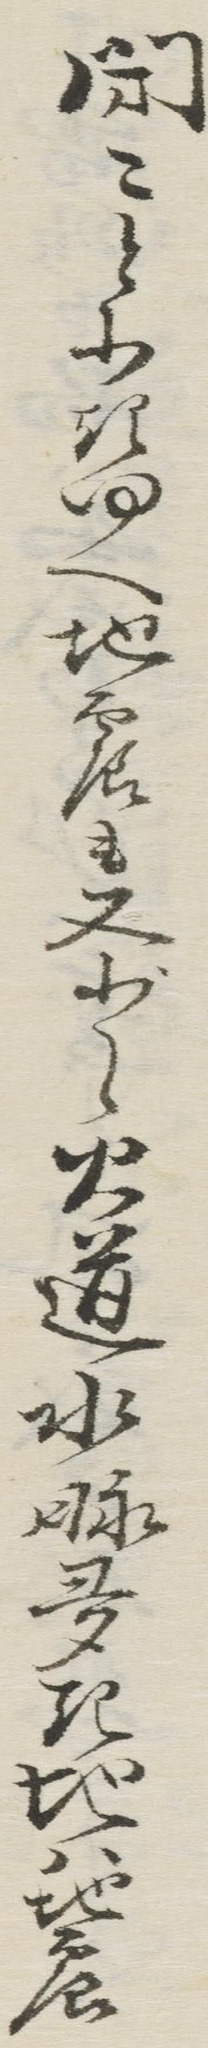閉こと少きゆへ地震も又少し火道水脉多き地ハ地震
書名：諸国大地震大津波一代記
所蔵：東京大学地震研究所図書室 Earthquake Research Institute Library, The University of Tokyo, JAPAN
